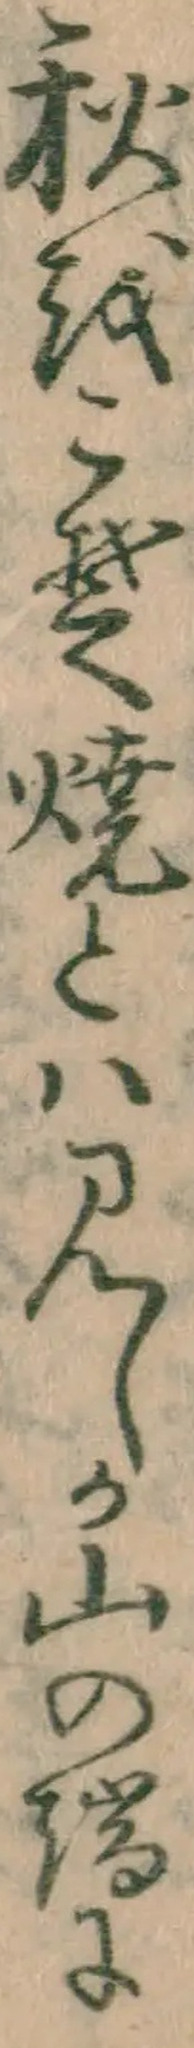秋をこそ焼とは見しか山の端に
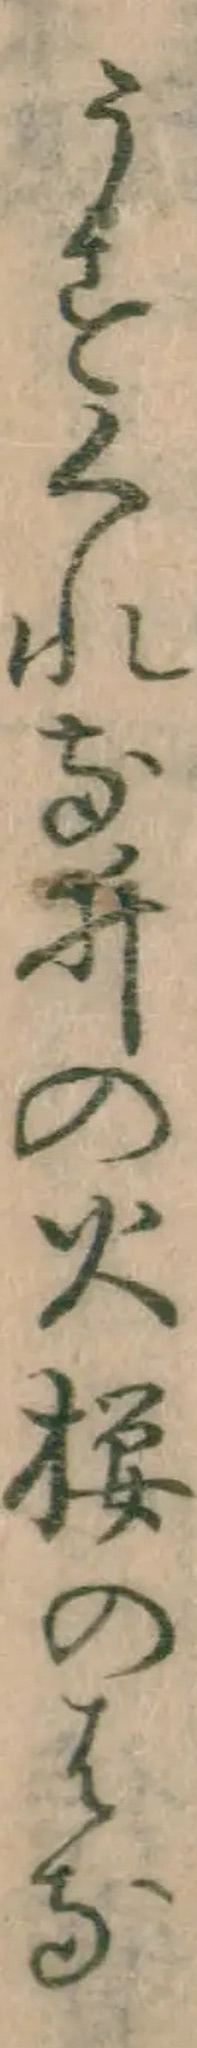うすくれなゐの火桜のはな

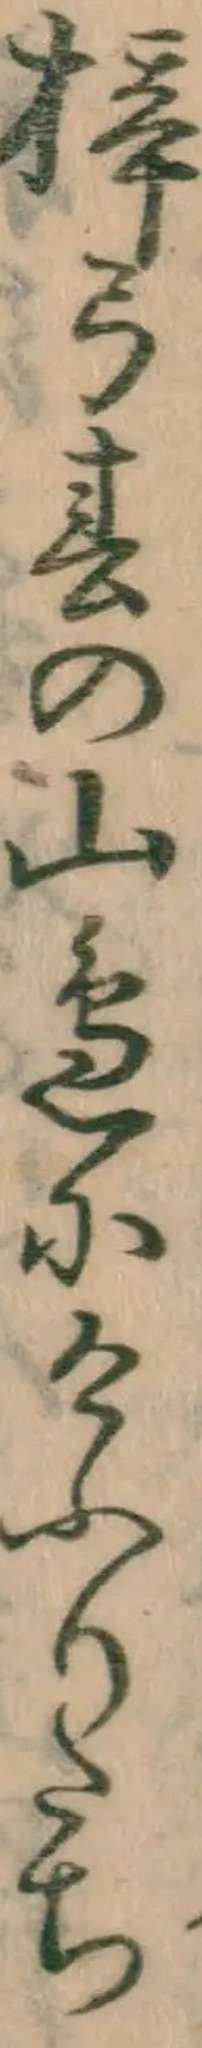梓弓春の山辺にけふりたち
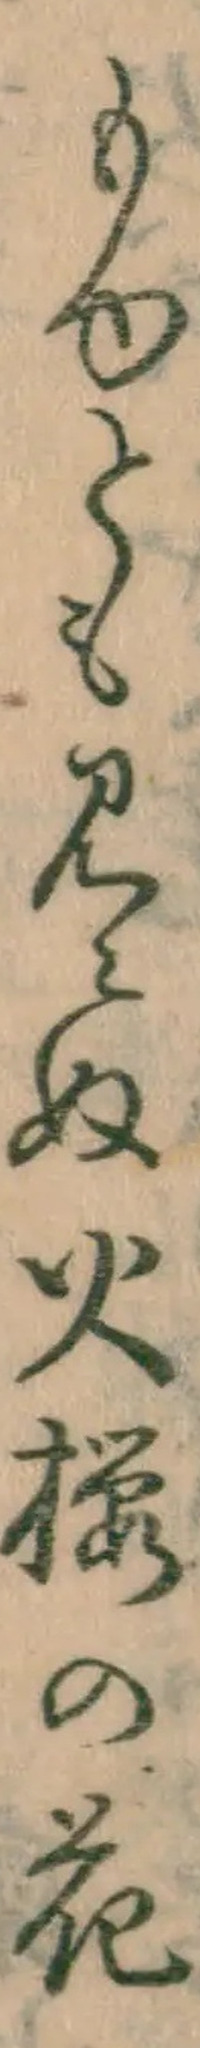もゆとも見えぬ火桜の花
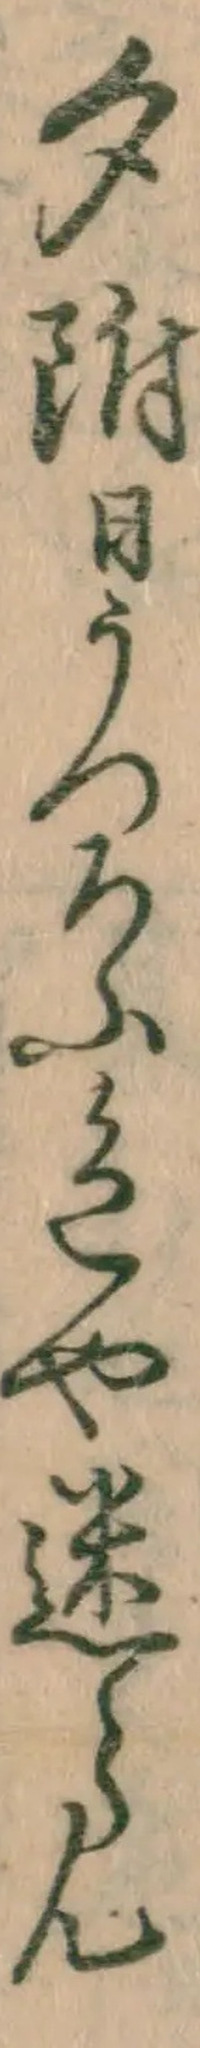夕附日うつろふ色や迷らん
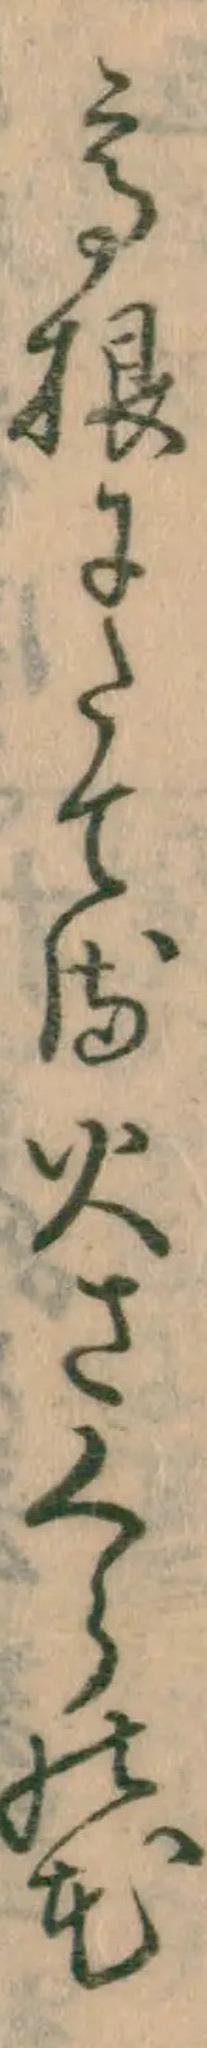高根にたてる火さくらの花
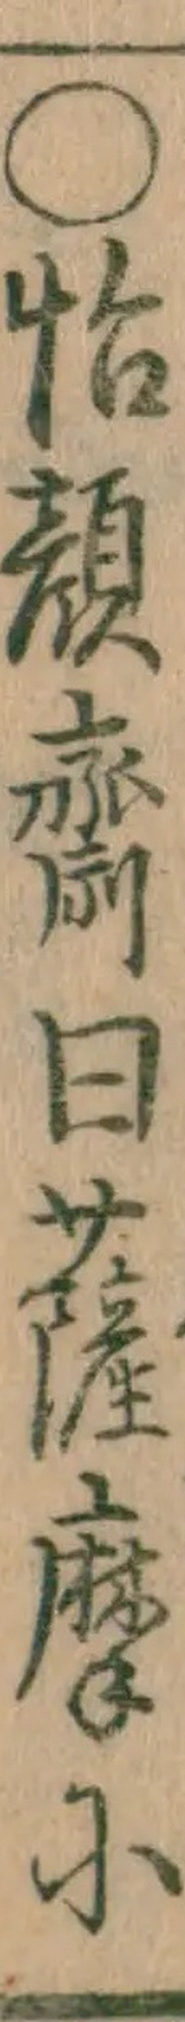○怡顔斎曰薩摩に
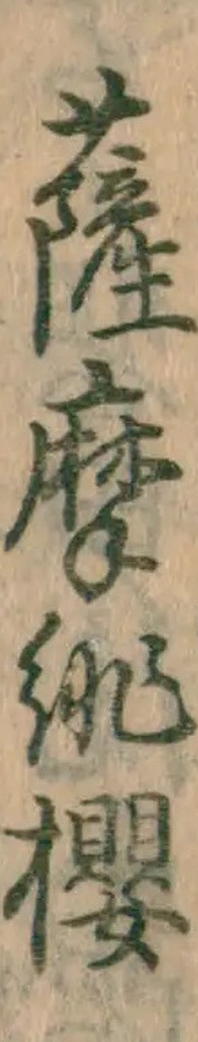薩摩緋桜
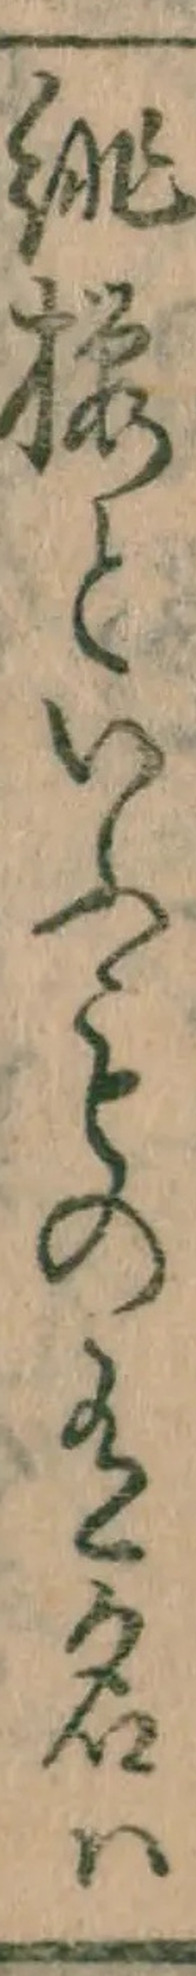緋桜といふもの有名は
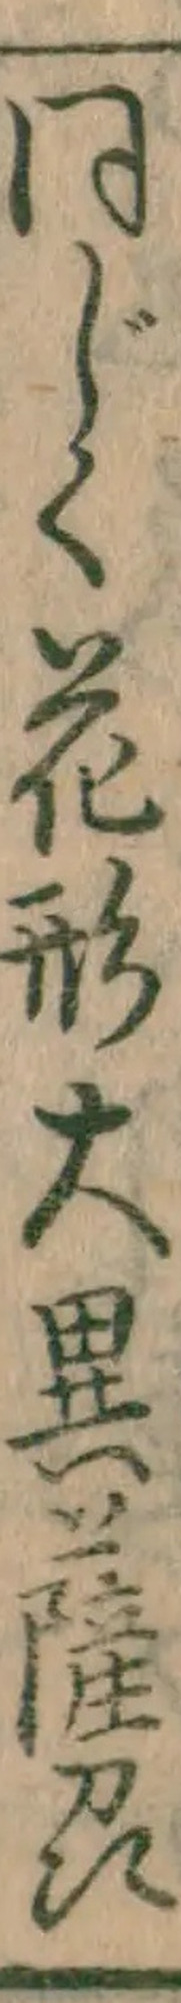同じく花形大異薩州
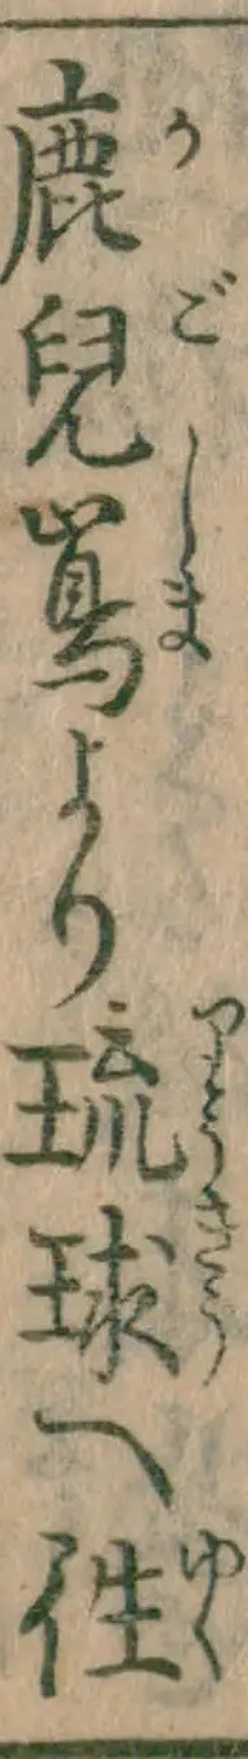鹿児島より琉球へ往
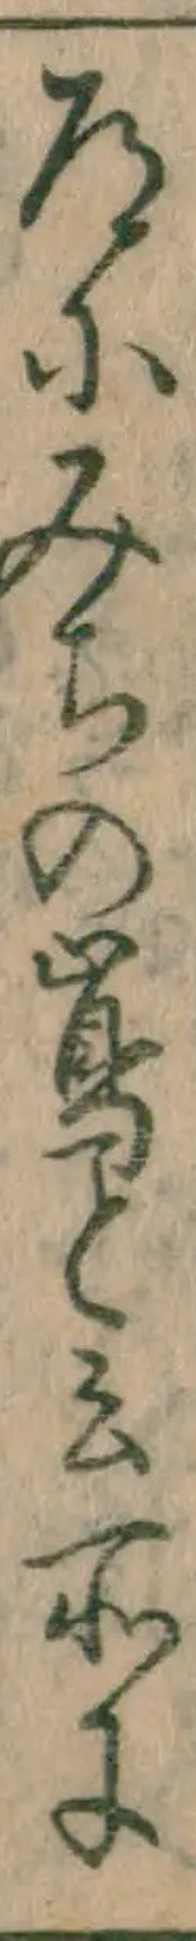道にみちの島と云所に
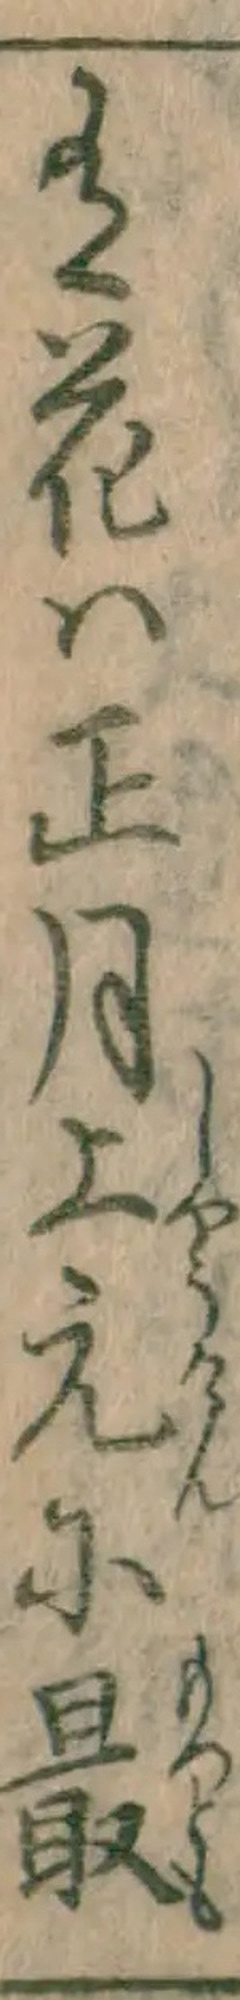有花は正月上元に最
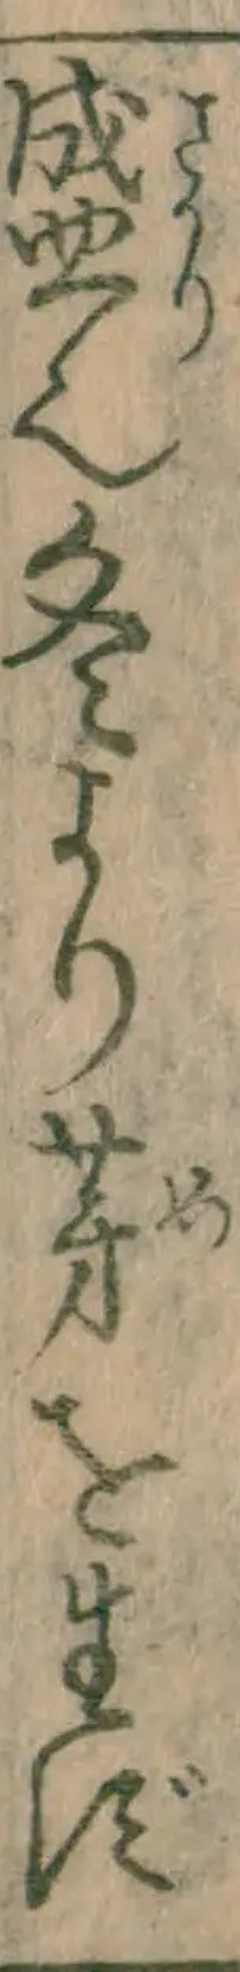盛也冬より芽を生ず

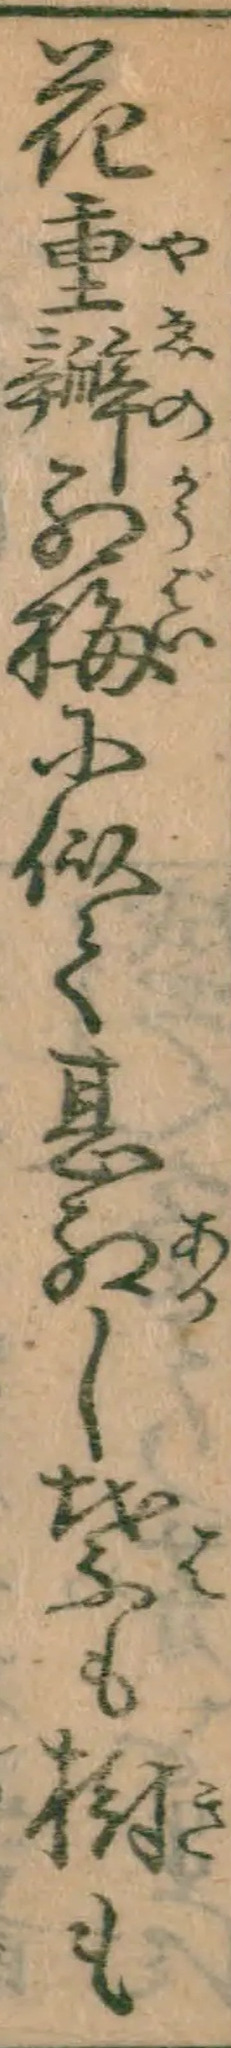花重弁紅梅に似て甚紅し葉も樹も
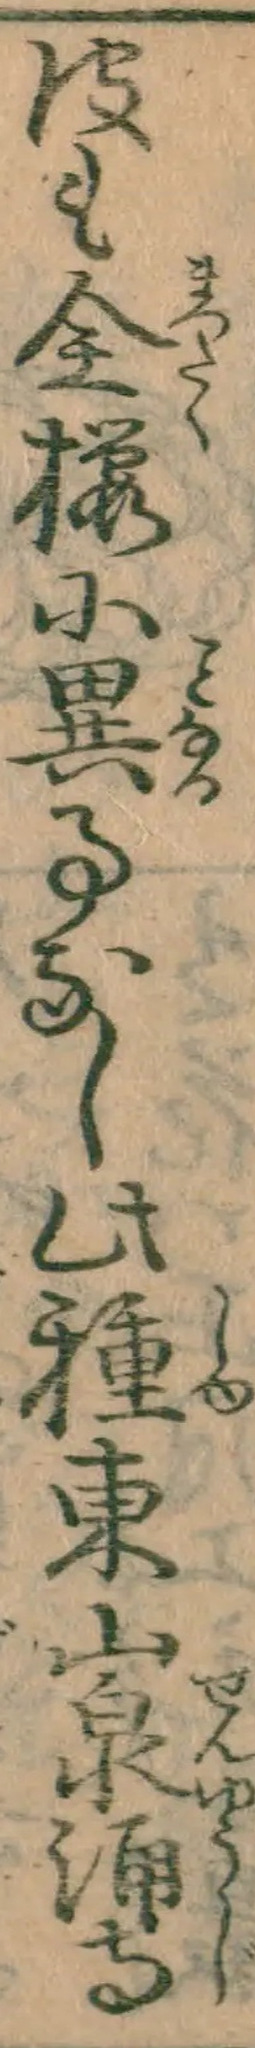皮も全桜に異事なし此種東山泉涌寺
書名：怡顔齋櫻品
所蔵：国立国会図書館 National Diet Library, JAPAN
